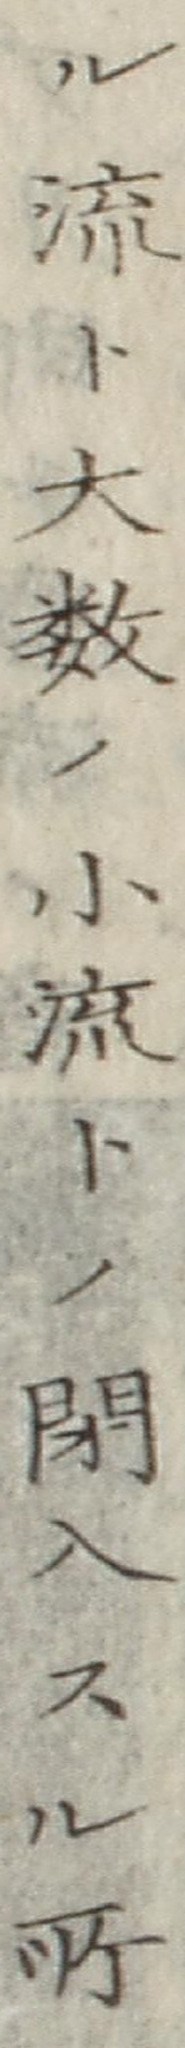ル流ト大数ノ小流トノ閉入スル所
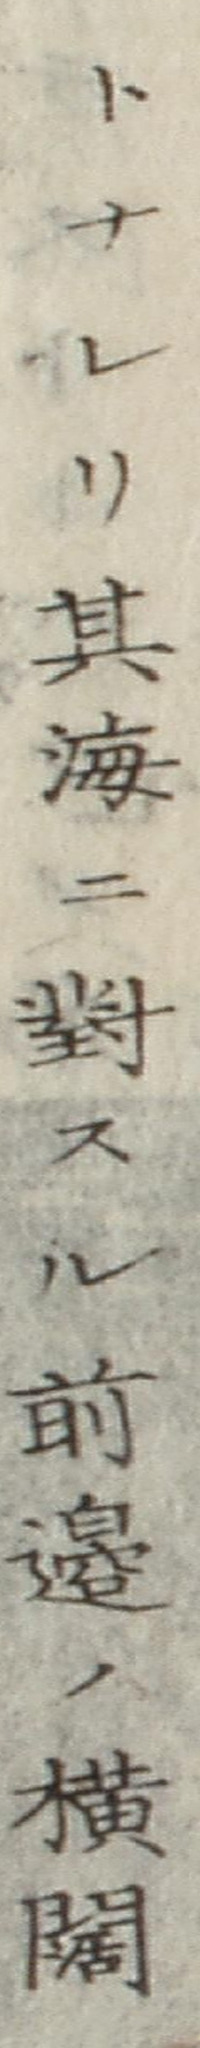トナレリ其海ニ対スル前辺ノ横闊
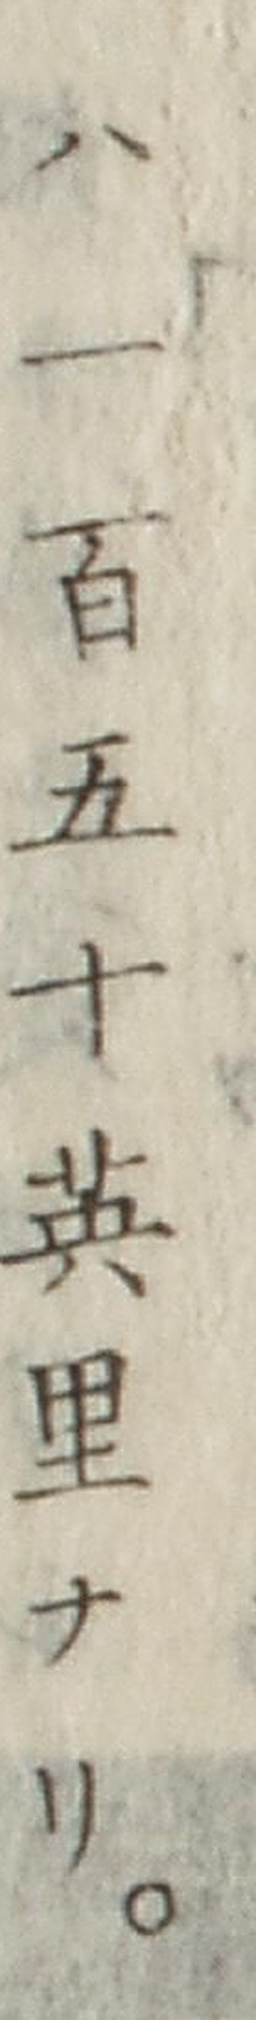ハ一百五十英里ナリ。
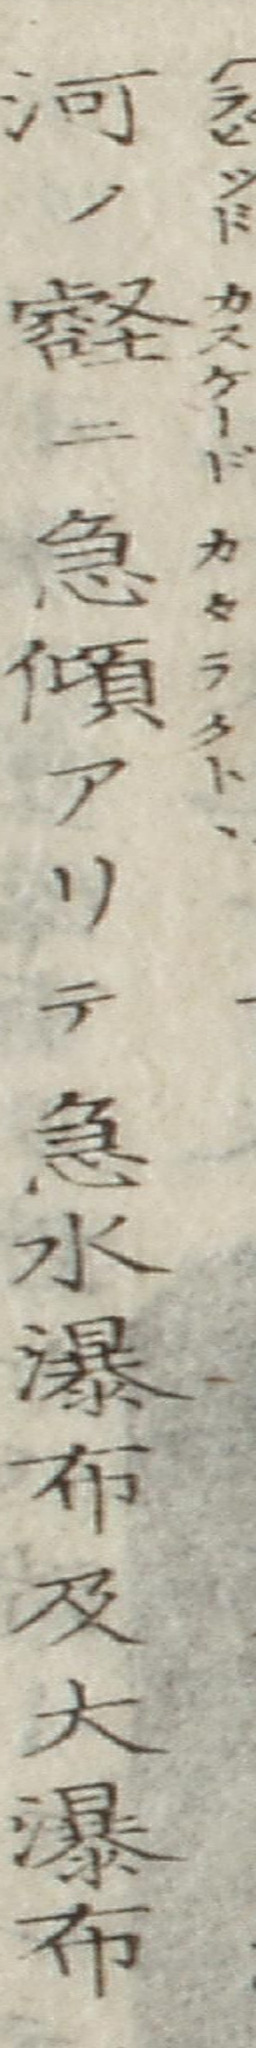河ノ壑ニ急傾アリテ急水瀑布及大瀑布
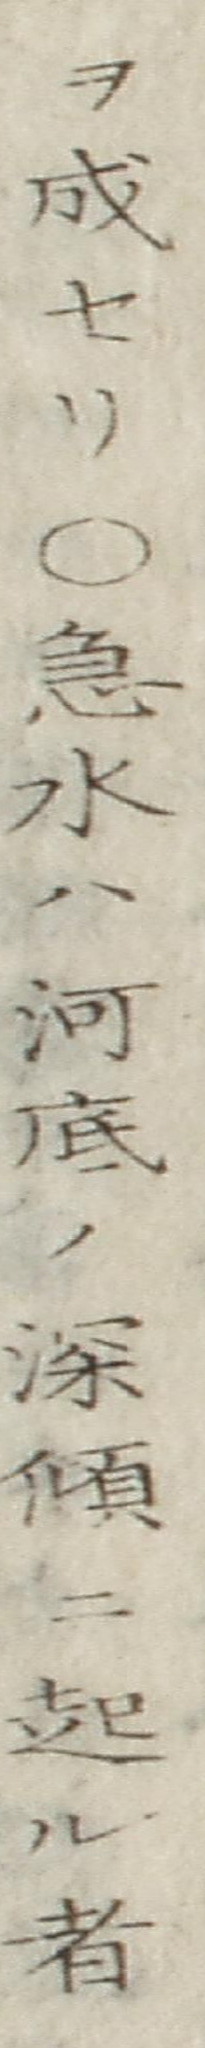ヲ成セリ〇急水ハ河底ノ深傾ニ起ル者
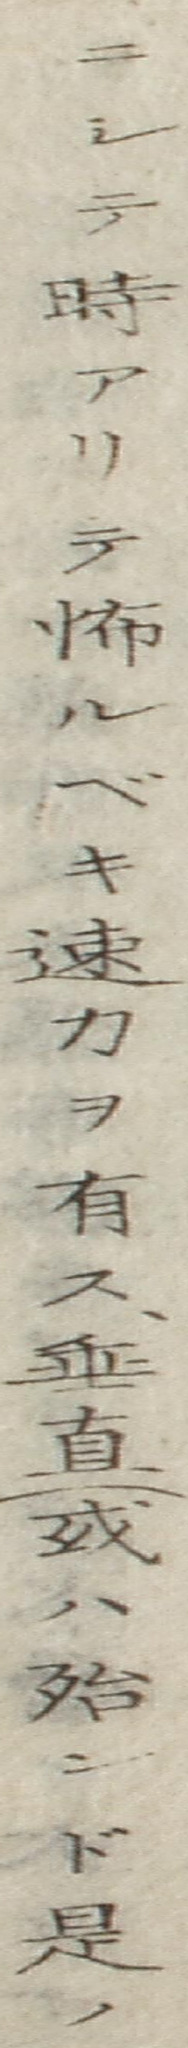ニシテ時アリテ怖ルベキ速力ヲ有ス、垂直（或ハ殆ンド是ノ
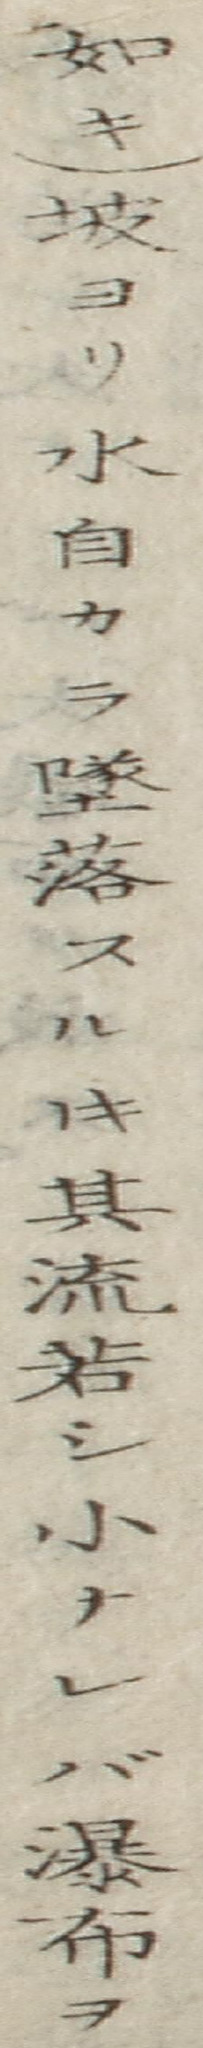如キ）坡ヨリ水自カラ墜落スルトキ其流若シ小ナレバ瀑布ヲ

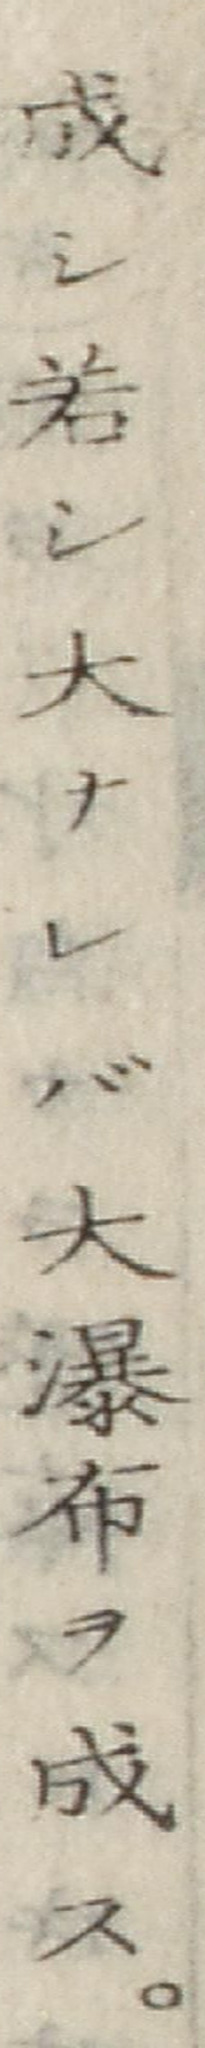成シ若シ大ナレバ大瀑布ヲ成ス。
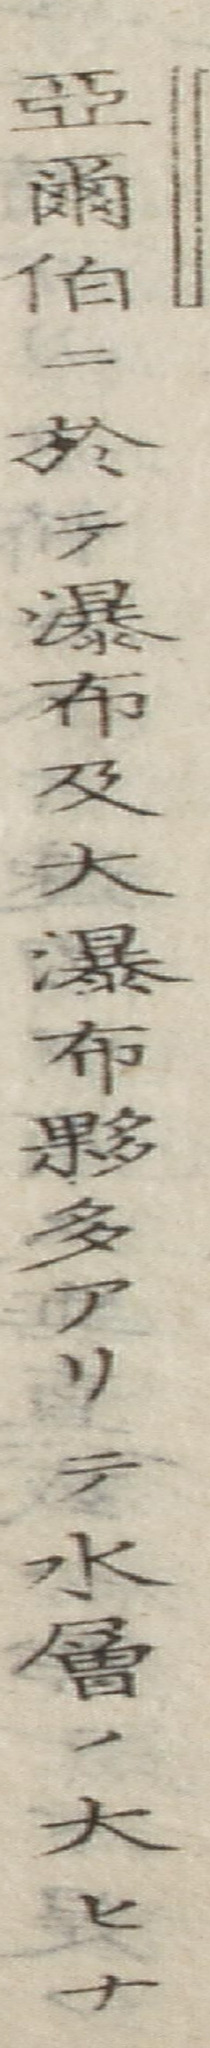亜爾伯ニ於テ瀑布及大瀑布夥多アリテ水層ノ大ヒナ
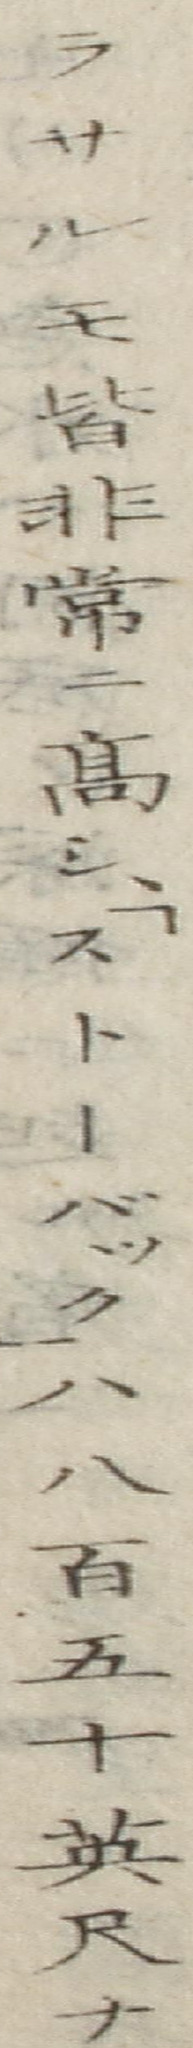ラサルモ皆非常ニ高シ、「ストーバック」ハ八百五十英尺ナ
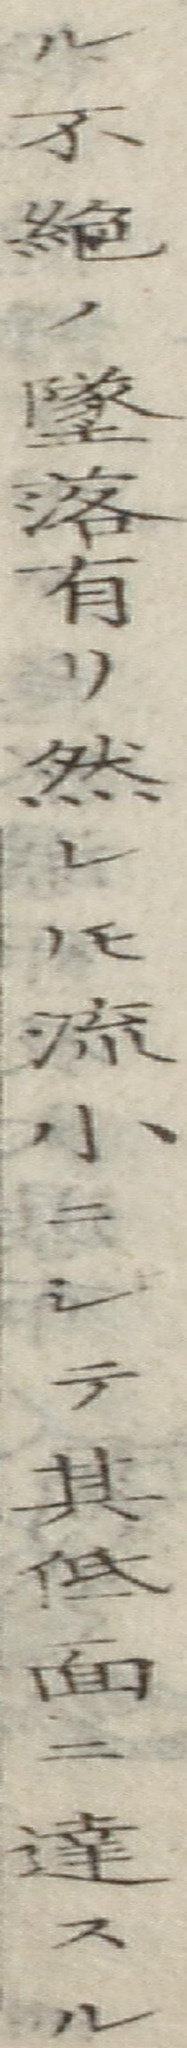ル不絶ノ墜落有リ然レトモ流小ニシテ其低面ニ達スル
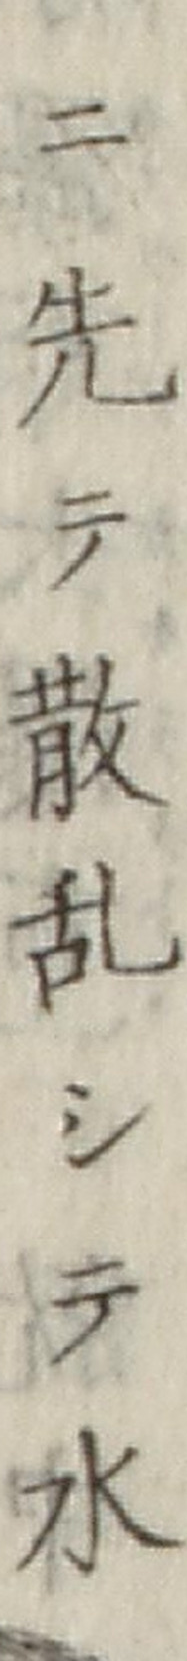ニ先テ散乱シテ水
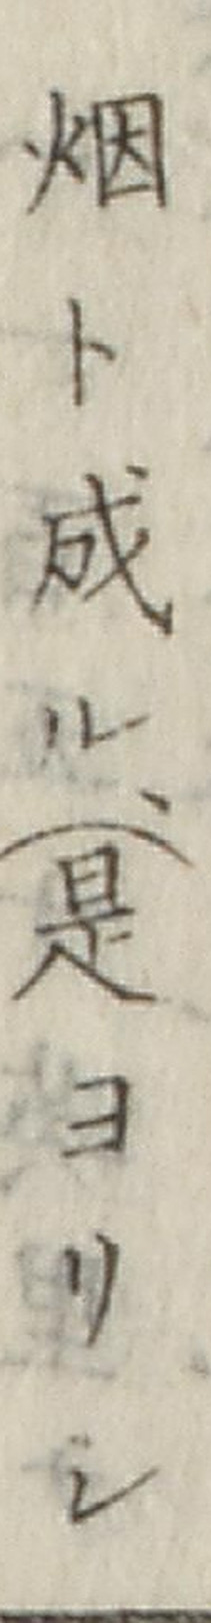煙ト成ル、（是ヨリシ
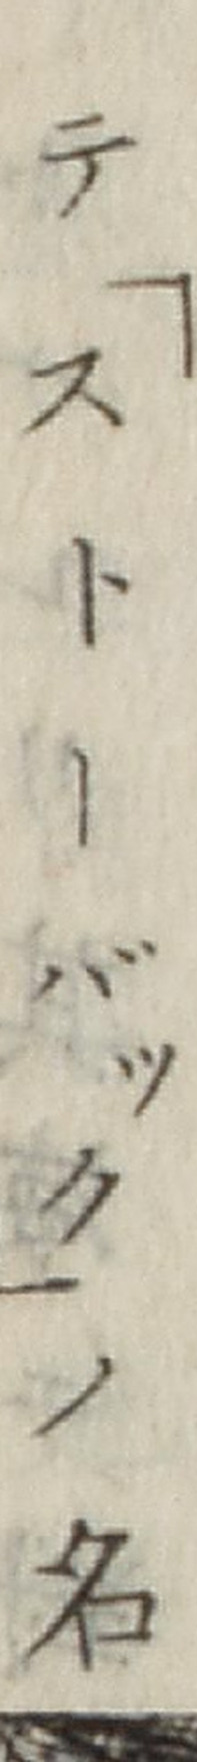テ「ストーバック」ノ名
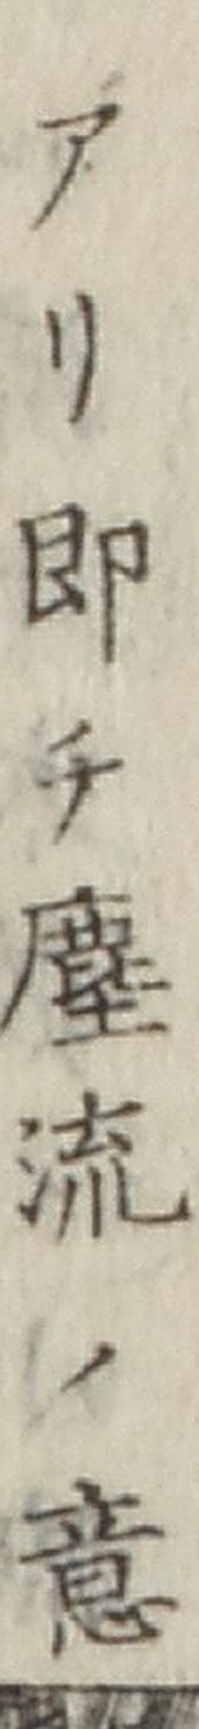アリ即チ塵流ノ意
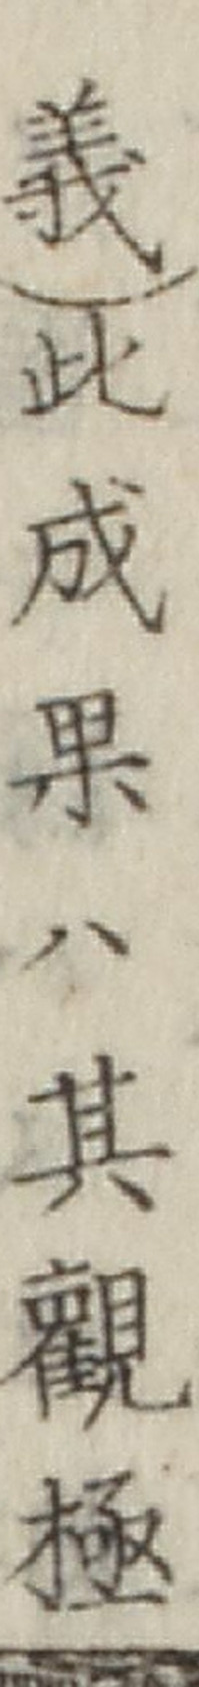義）此成果ハ其観極
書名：地形論　巻二
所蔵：東京大学地震研究所図書室 Earthquake Research Institute Library, The University of Tokyo, JAPAN
